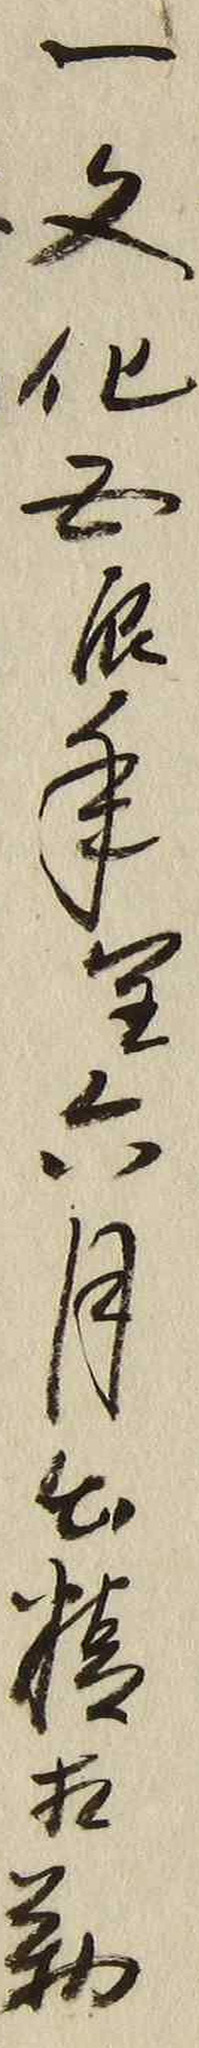一文化五辰年閏六月出精相勤
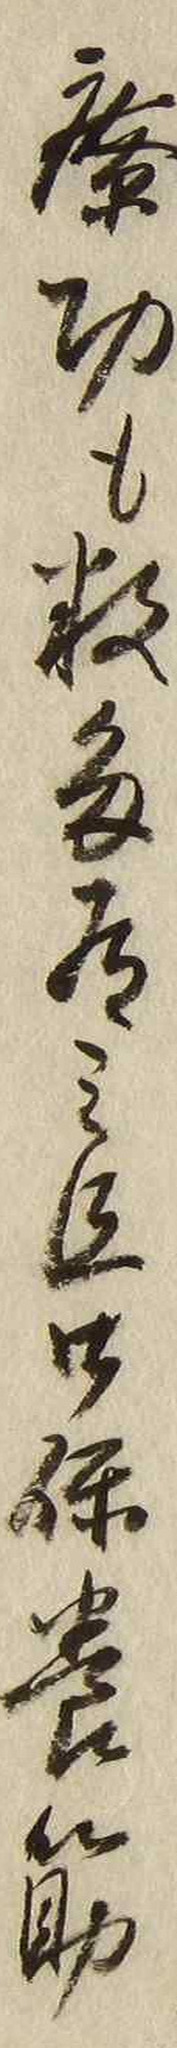療功も数多有之且御保養筋

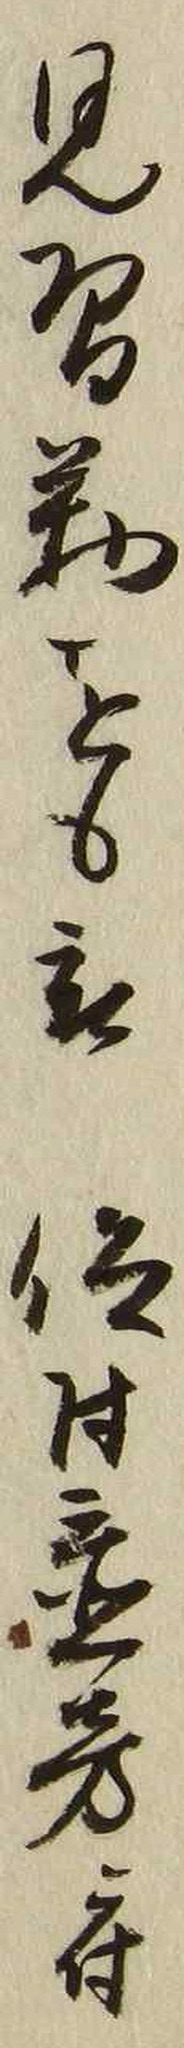見習方をも被仰付置旁ニ付
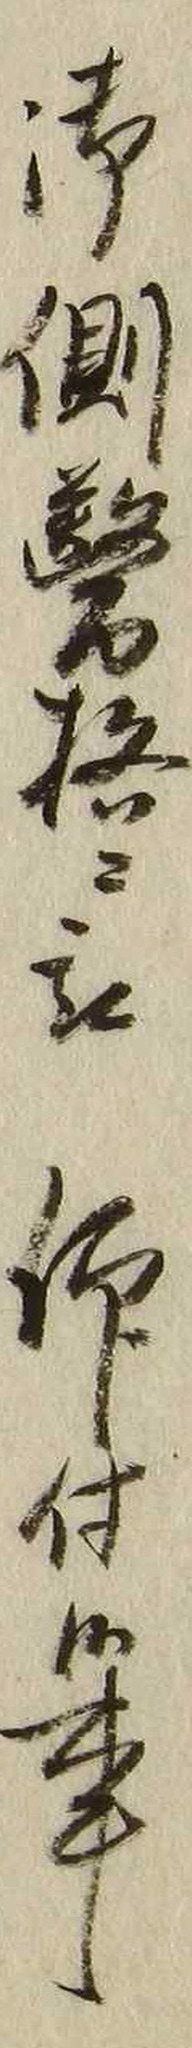御側医格ニ被仰付候事
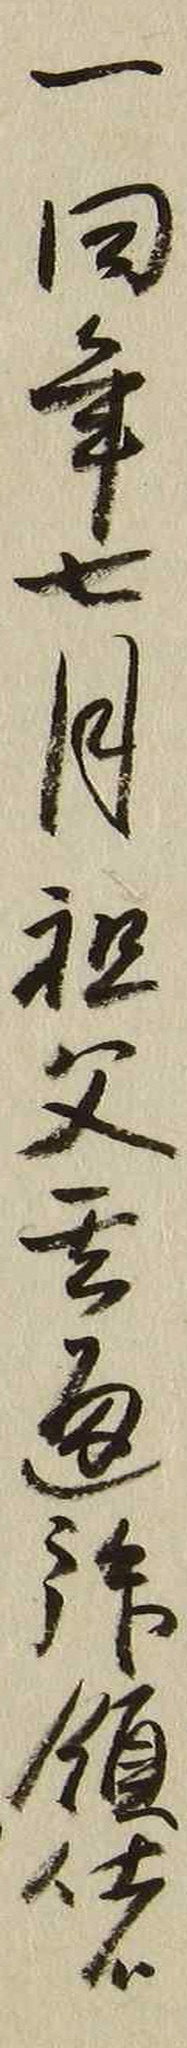一同年七月祖父玄通拝領仕候
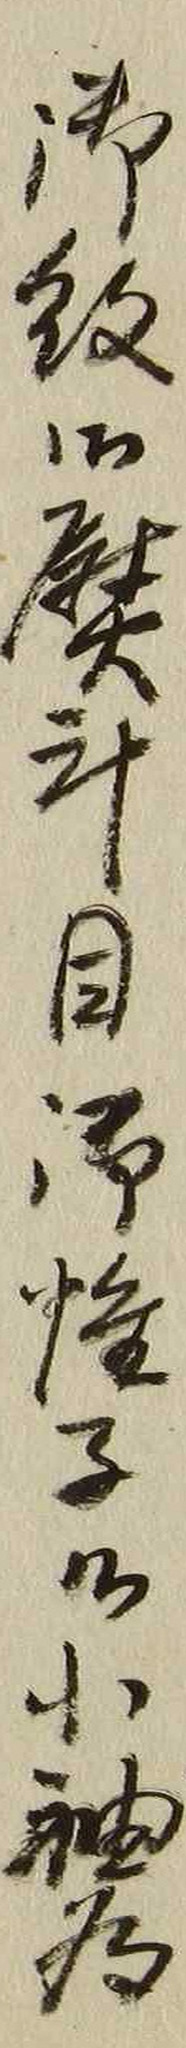御紋御熨斗目御帷子御小袖為
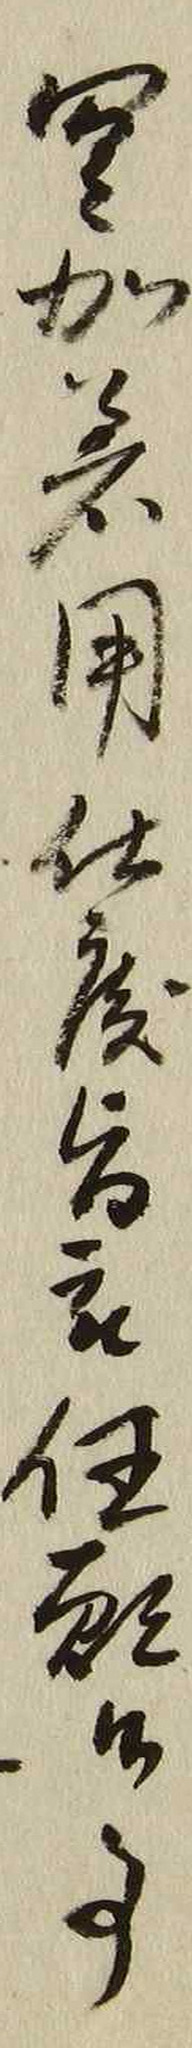冥加着用仕度旨被任願候事
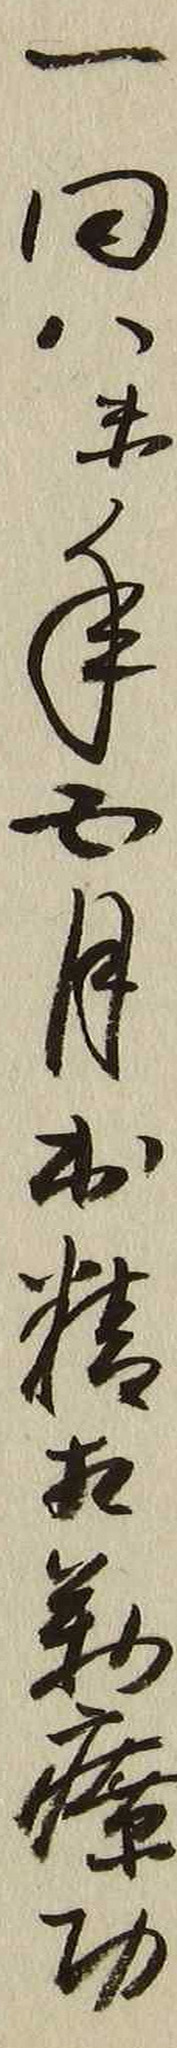一同八未年五月出精相勤療功
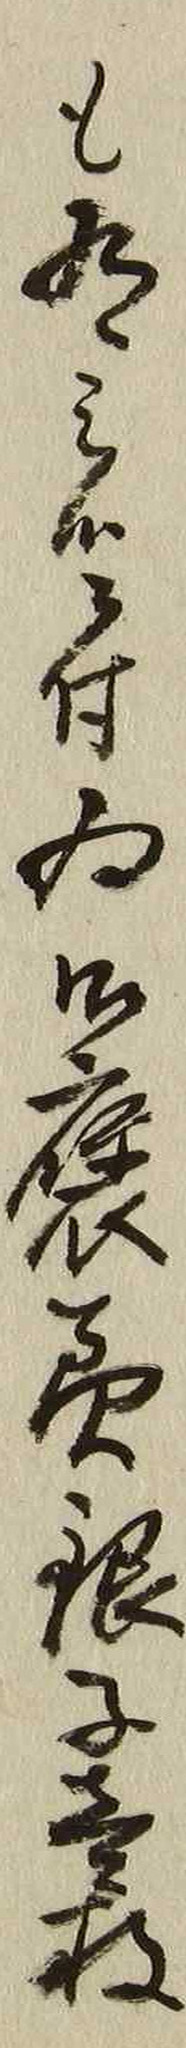も有之候ニ付為御褒美銀子壱枚
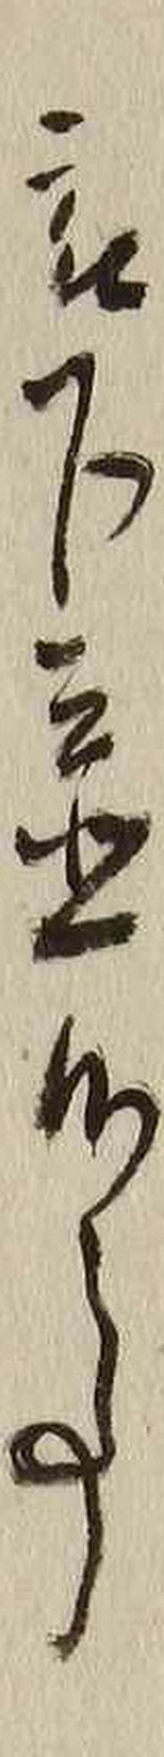被下置候事
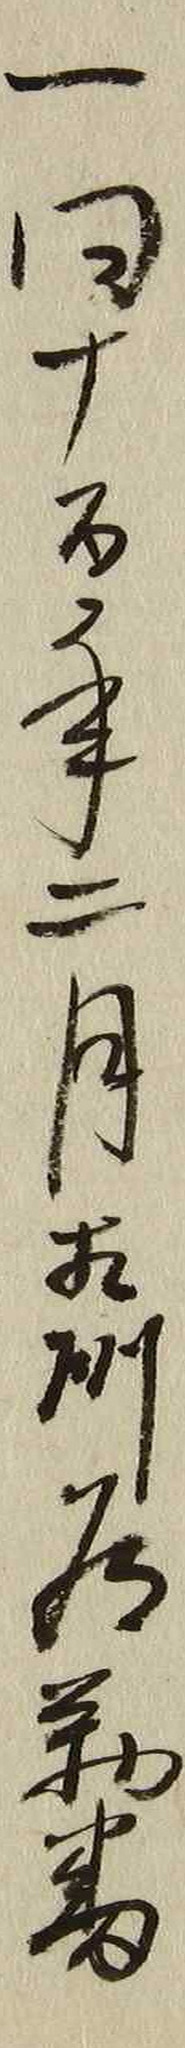一同十酉年二月相州為勤番
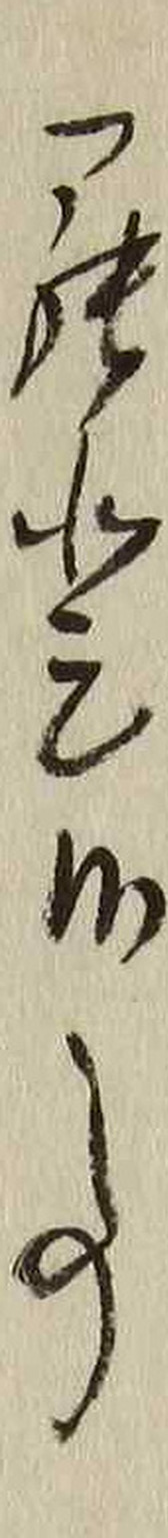罷登候事
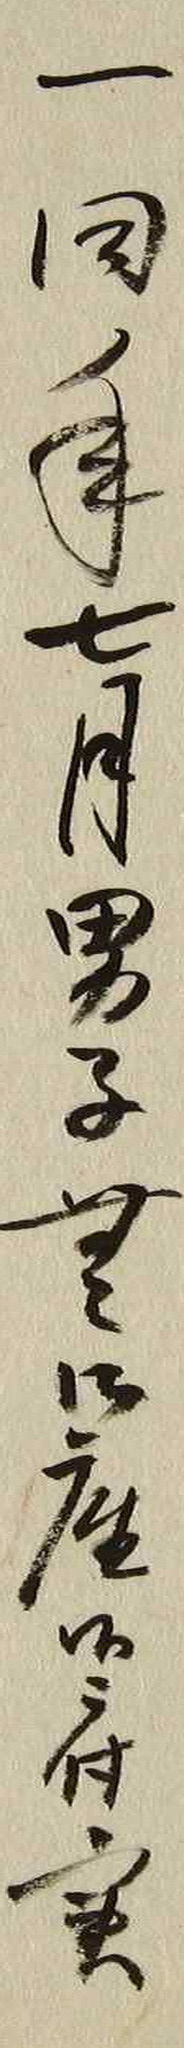一同年七月男子無御座候ニ付実
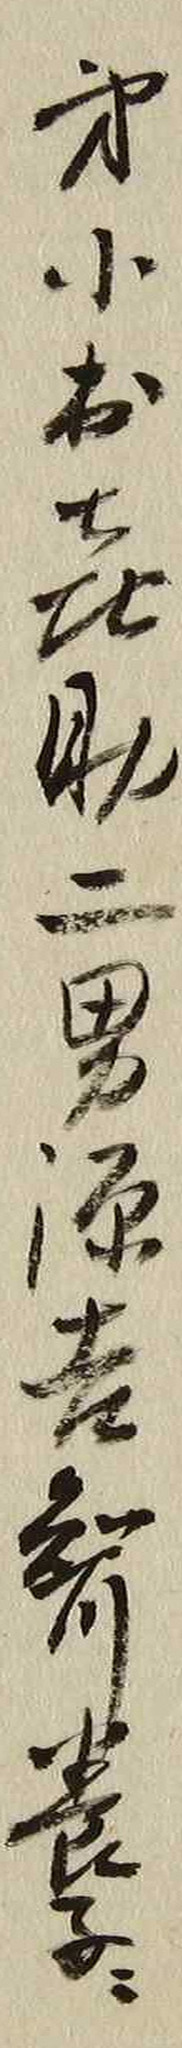弟小出喜助二男源吉婿養子ニ
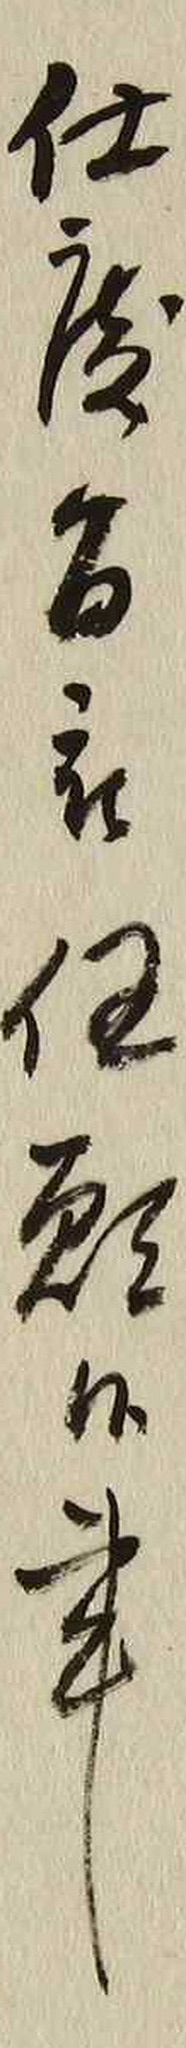仕度旨被任願候事
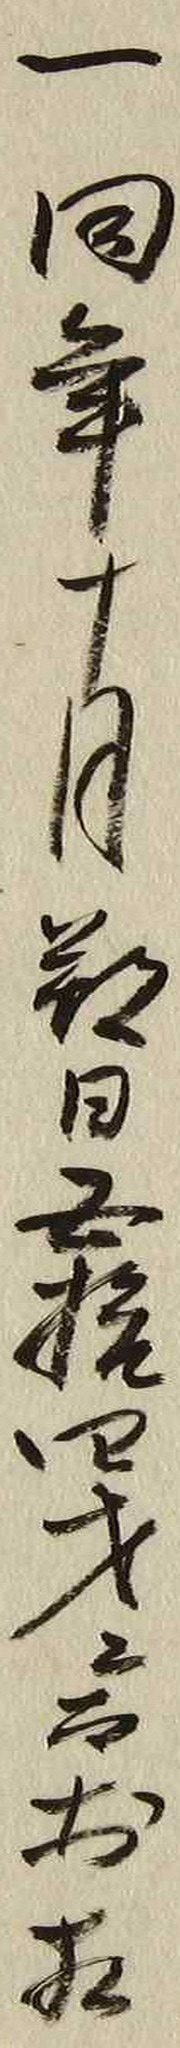一同年十月朔日五拾四才ニ而於相
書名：諸士系譜　巻之353　す之部3
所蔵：会津若松市立会津図書館
